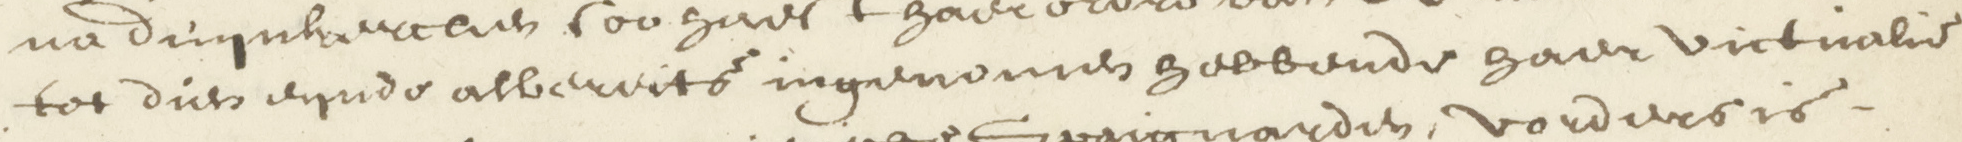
tot dien eynde albereits ingenomen hebbende haer victualie
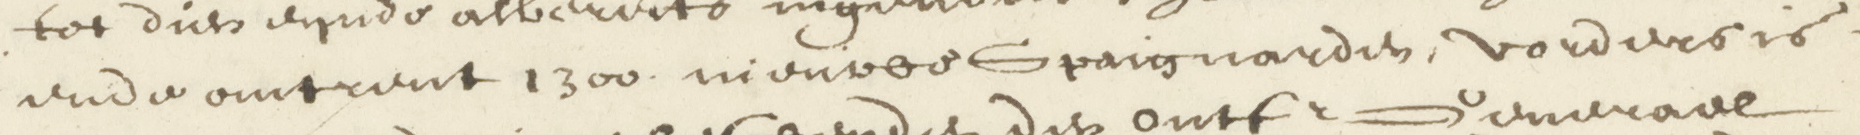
ende omtrent 1300. nieuwe Spaignarden, vorders is
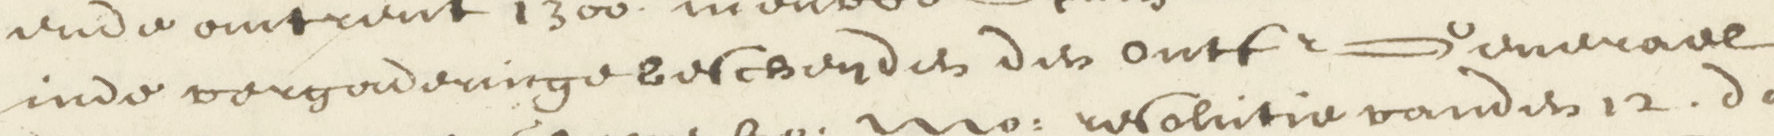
inde vergaderinge bescheyden den ontfr Generael
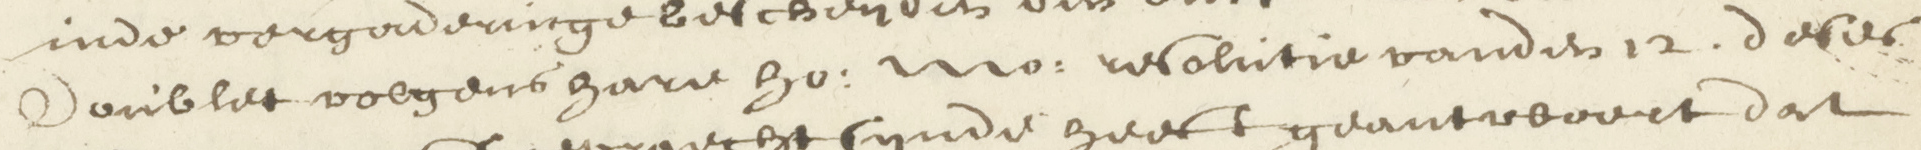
Doublet volgens hare Ho:Mo: resolutie vanden 12. deses
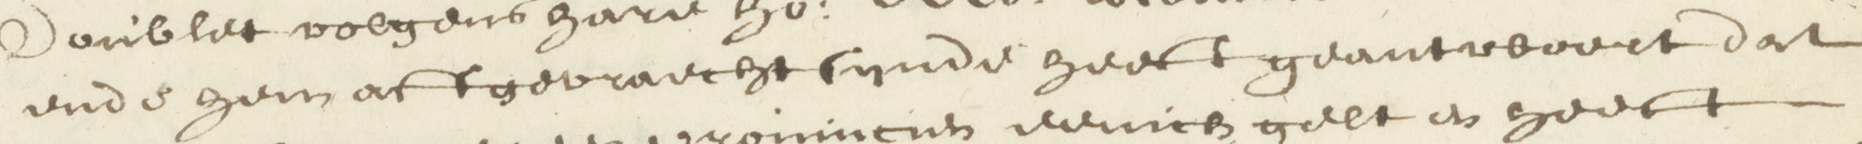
ende hem affgevraecht synde heeft geantwoort dat
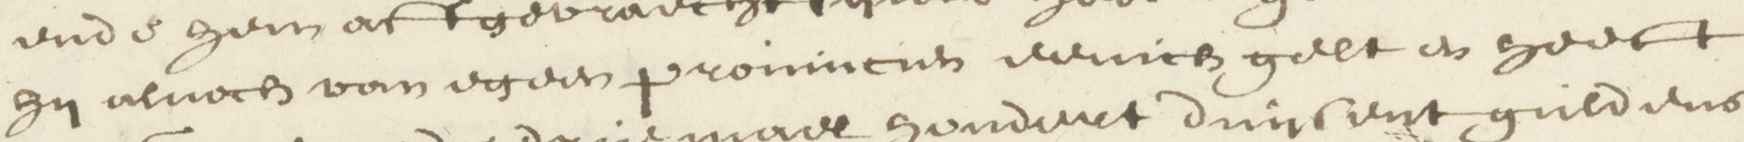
hy alnoch van egeen prouincien eenich gelt en heeft
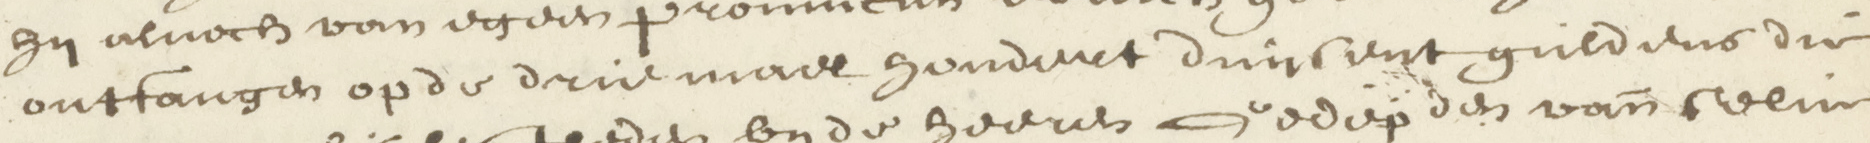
ontfangen opde drie mael hondert duysent guldens die
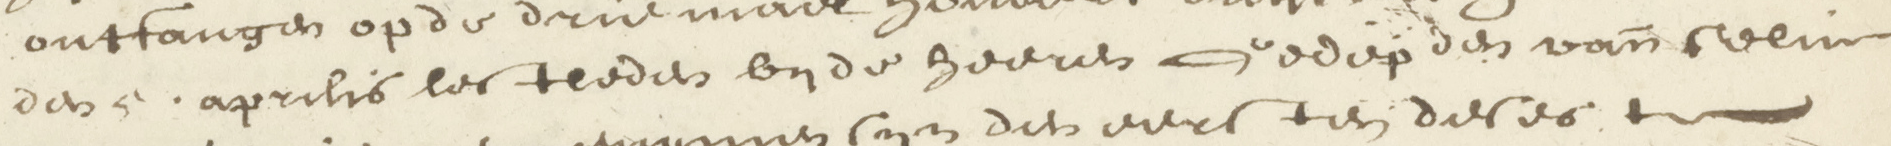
den 5. aprilis lestleden by de heeren Gedepden. van selue
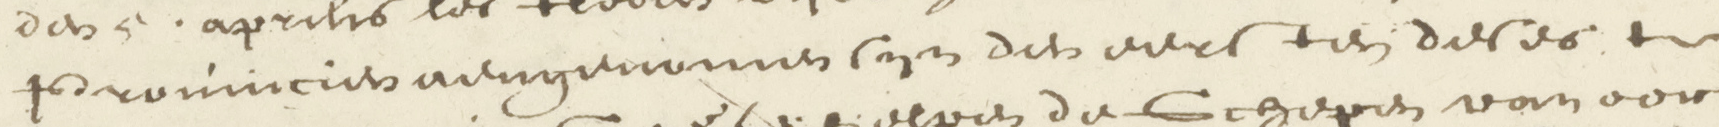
Prouincien aengenomen syn den eersten deses te
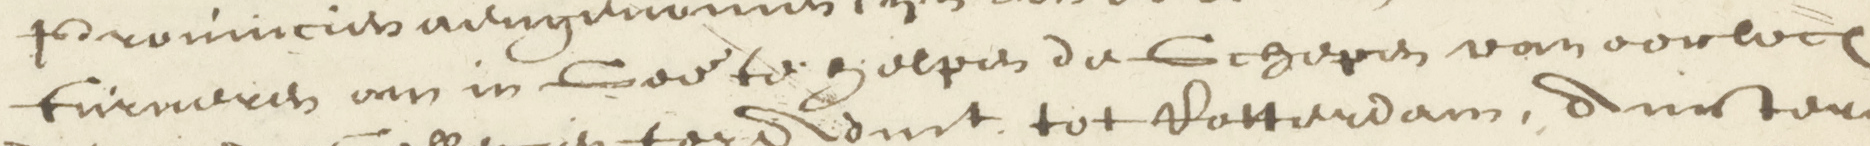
furneren om in See te helpen de Schepen van oorloch
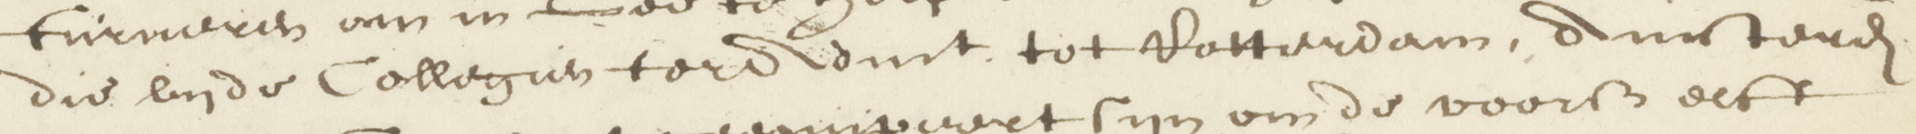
die by de Collegien ter Admt. tot Rotterdam, Amsterd.
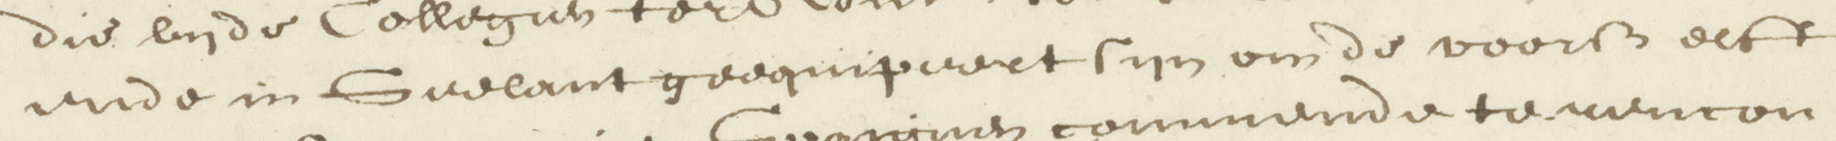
ende in Seelant geequipeert syn om de voors elff
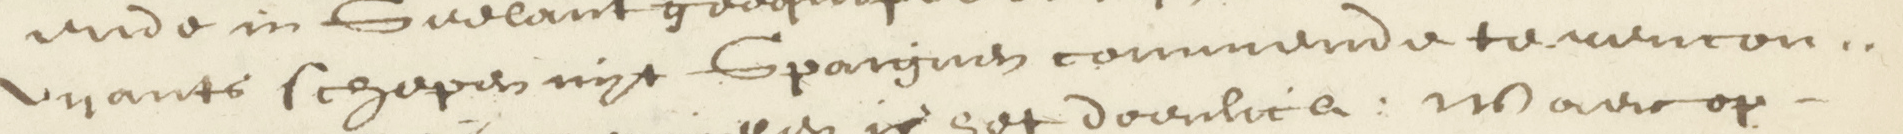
vyants schepen uyt Spaignen commende te rencon„
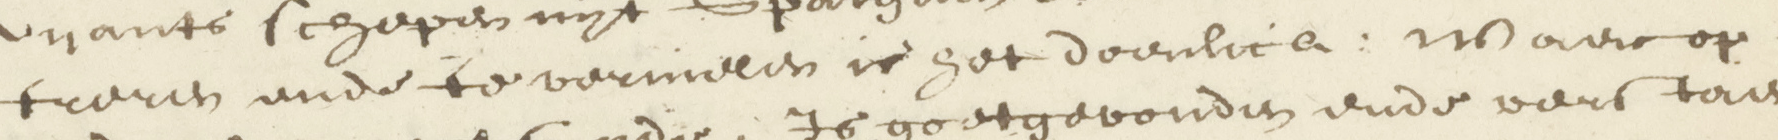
treren ende te vernielen is het doenlick. Waer op
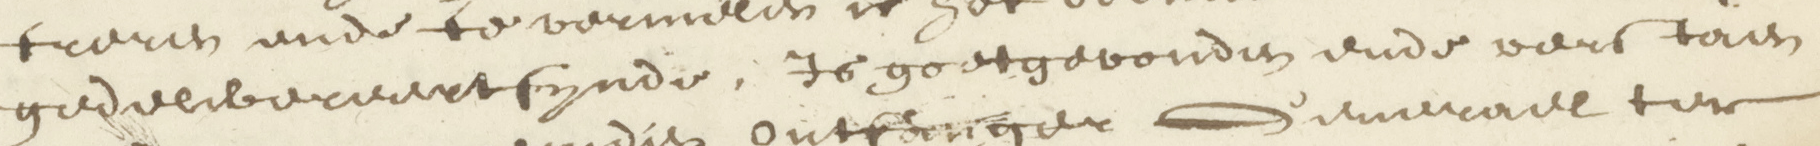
gedelibereert synde, Is goetgevonden ende verstaen
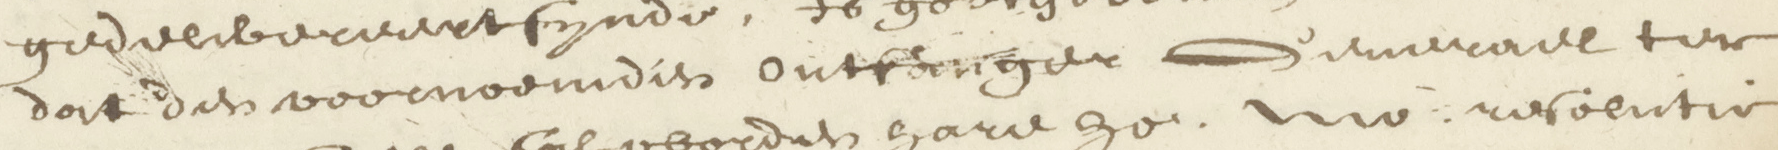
dat den voornoemden ontfanger Generael ter
